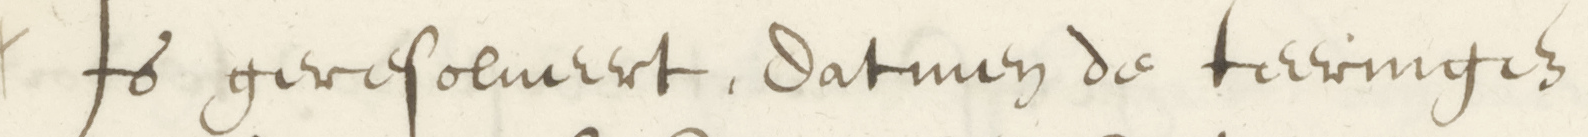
Is geresolueert, datmen de teeringen
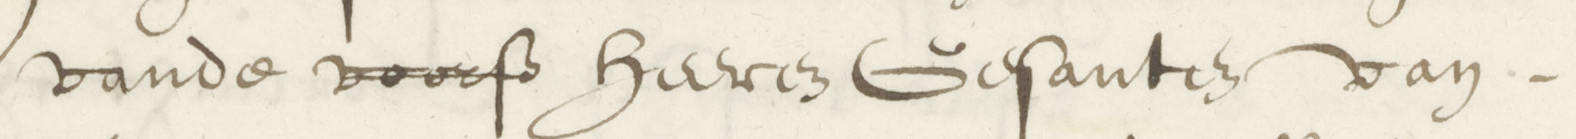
vande voors heeren Gesanten van
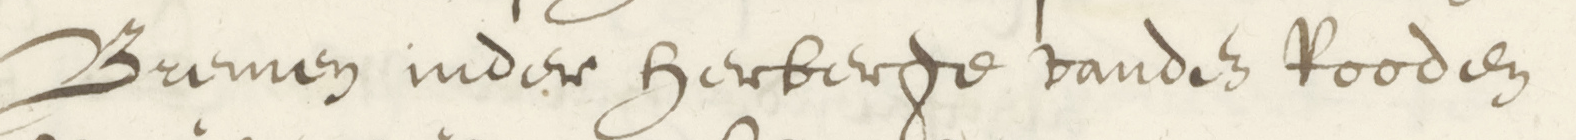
Bremen inder herberge vanden Rooden
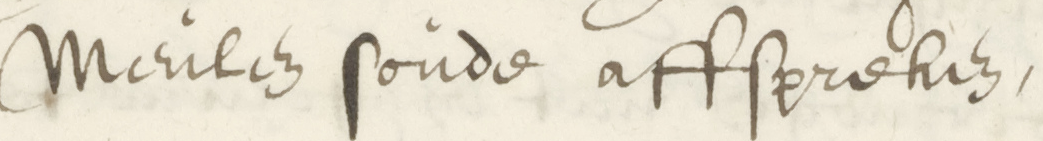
Meulen soude affspreken.
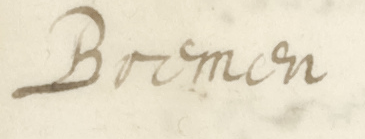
Bremen
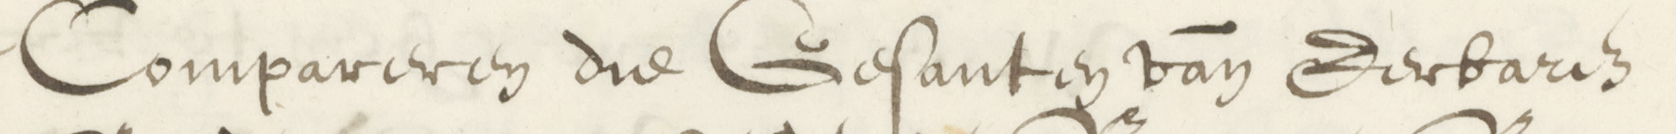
Compareren die Gesanten van Eerbaren
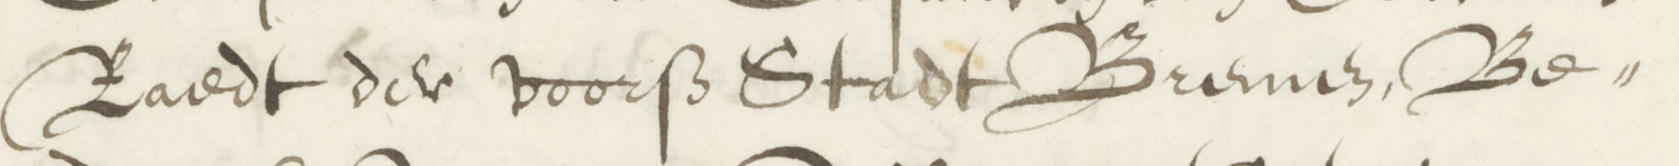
Raedt der voors Stadt Bremen, Be„
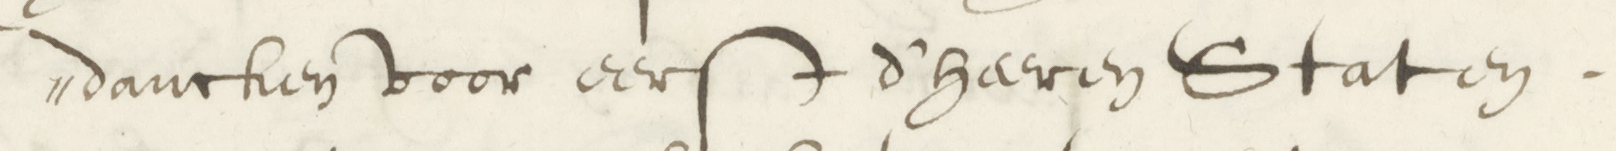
„dancken voor eerst d‛haeren Staten
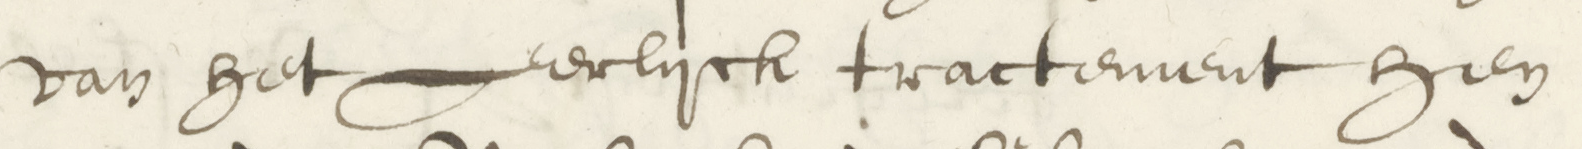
van het eerlyck tractement hen
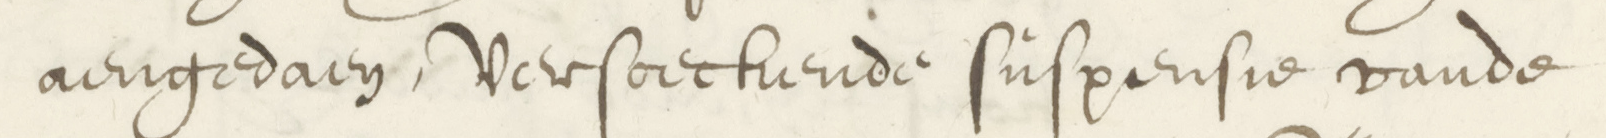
aengedaen, Versoeckende suspensie vande
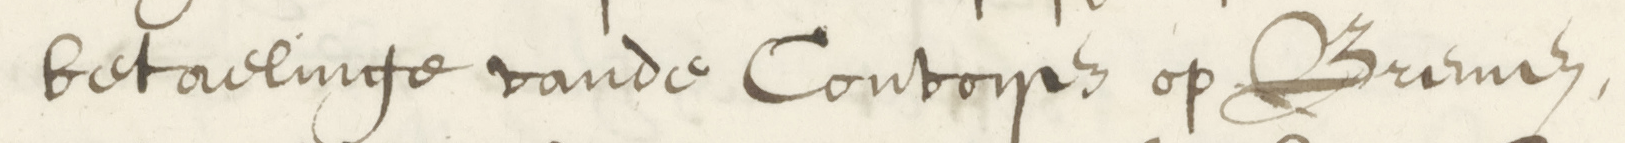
betaelinge vande Convoyen op Bremen,
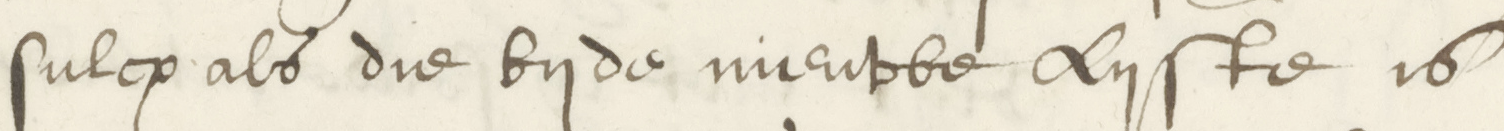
sulcx als die byde nieuwe Lyste is
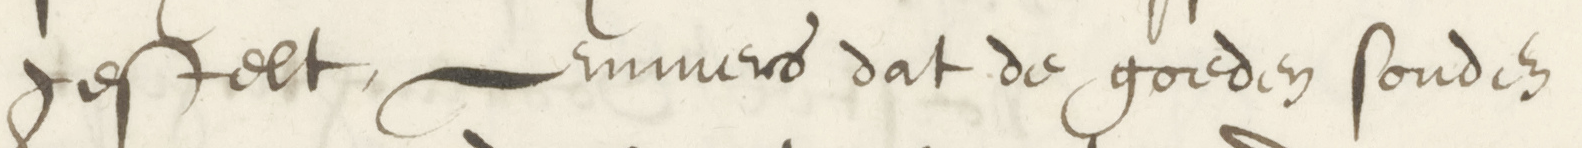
gestelt, emmers dat de goeden souden
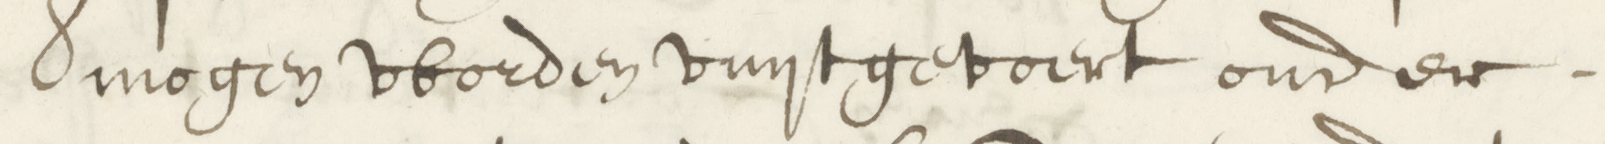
mogen worden vuytgevoert onder
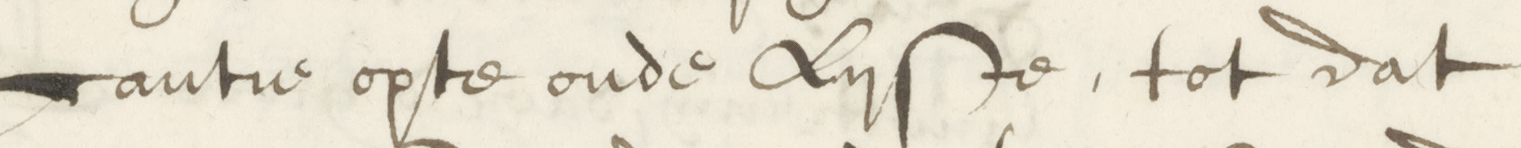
causie opte oude Lyste, tot dat
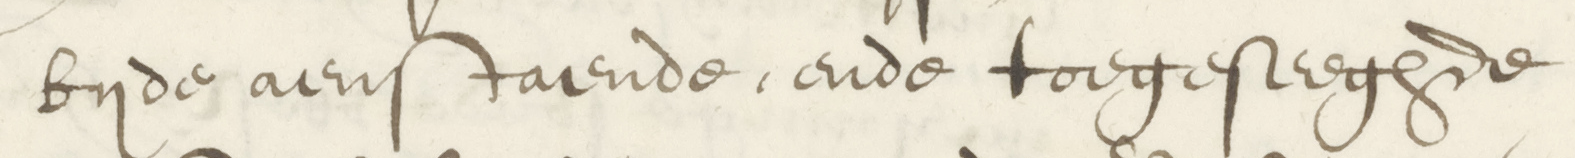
byde aenstaende, ende toegeseeghde
